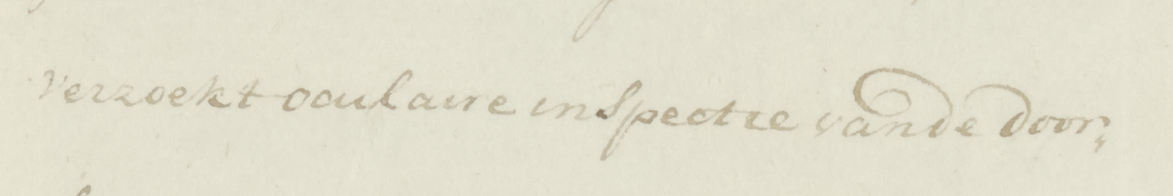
verzoekt oculaire inspectie vande door„,
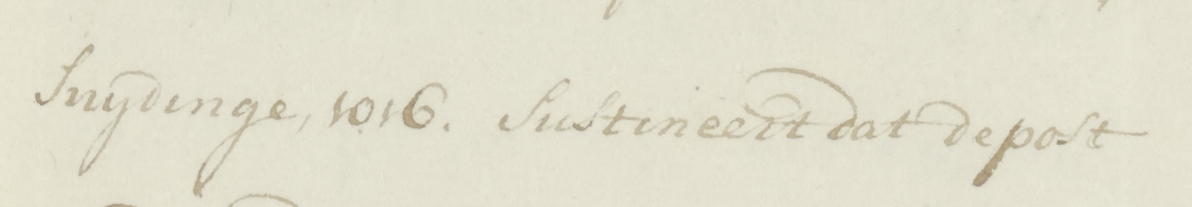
snydinge, 1016. Sustineert dat de post
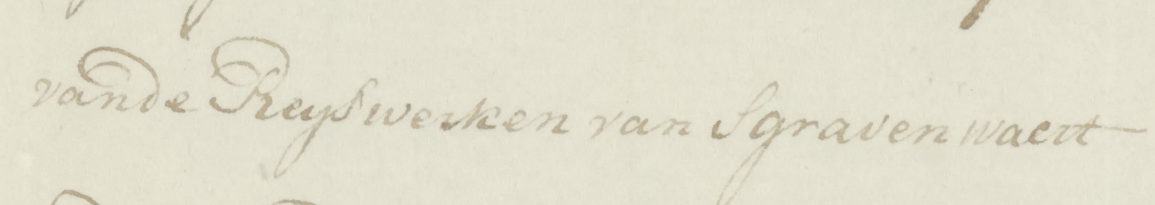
vande Reyswerken van Sgravenwaert
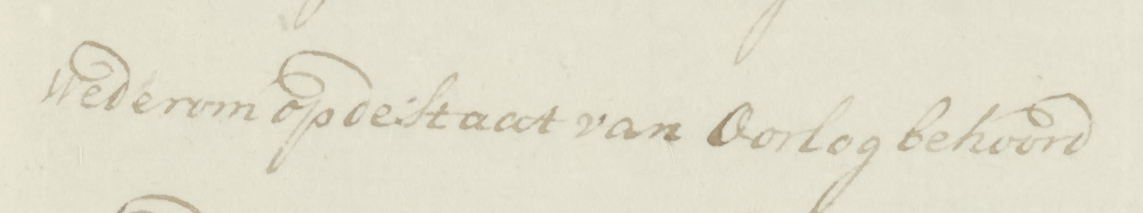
wederom op de staat van oorlog behoord
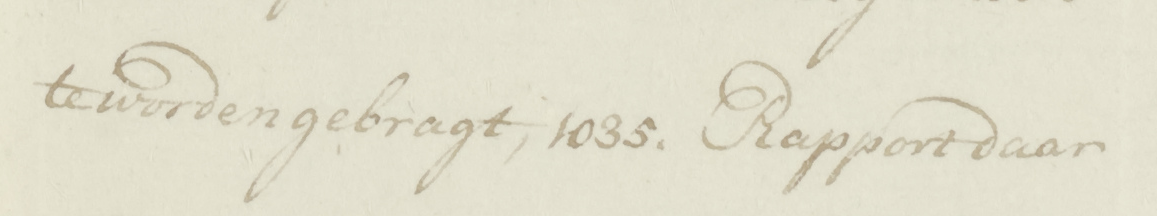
te worden gebragt, 1035. Rapport daar
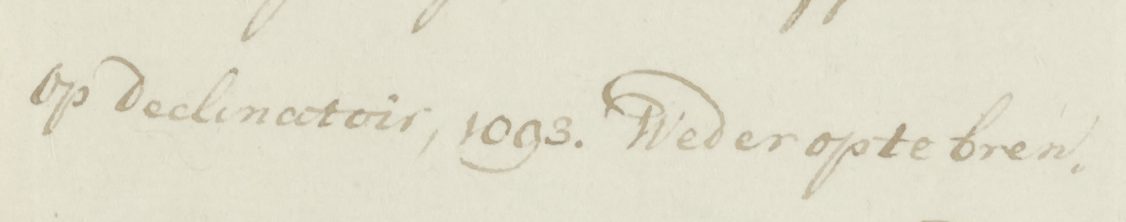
op declinatoir, 1093. Weder opte bren,,
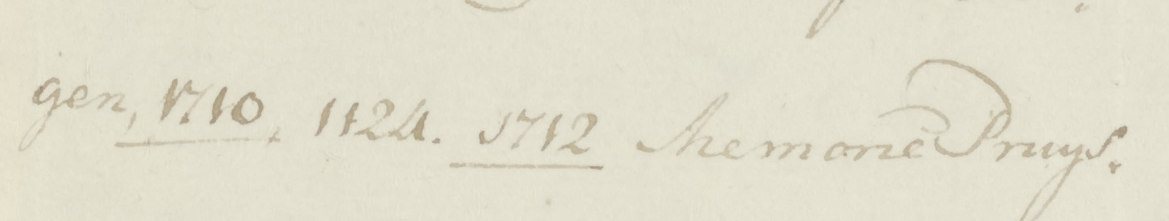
gen, 1710, 1124. 1712 Memorie Pruys„
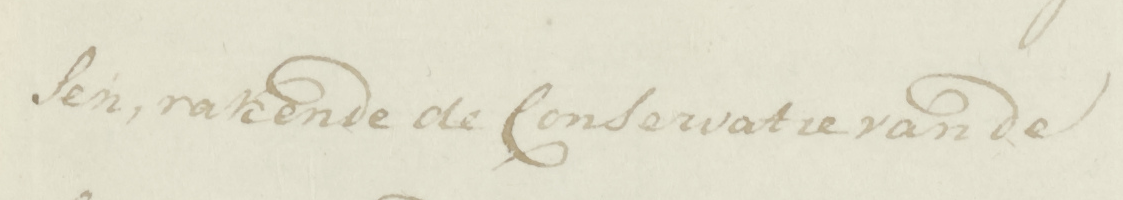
sen, rakende de Conservatie van de
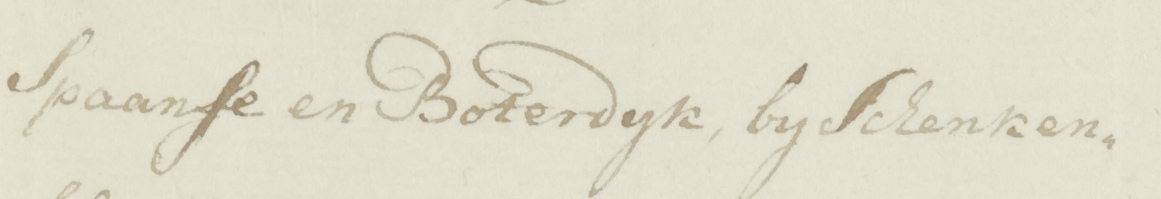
Spaanse en Boterdyk, by Schenken„,
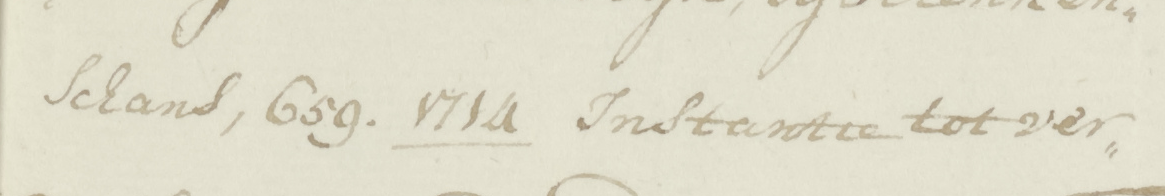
Schans, 659. 1714, Instantie tot ver„
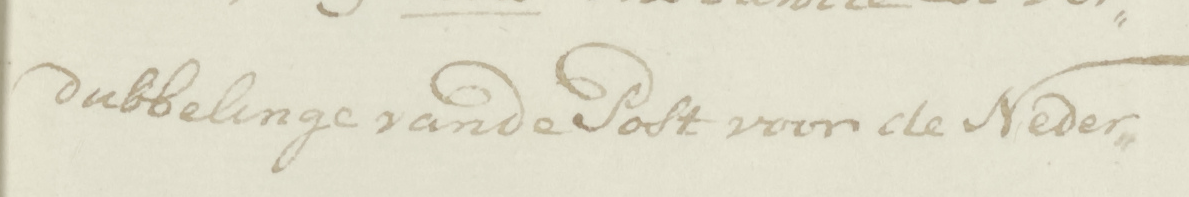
dubbelinge vande Post voor de Neder„
